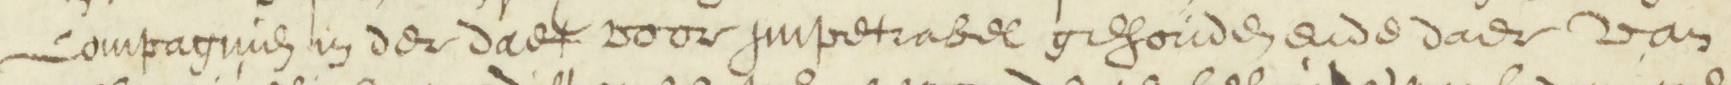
Compagnien in der daet voor impetrabel gehouden ende daer van
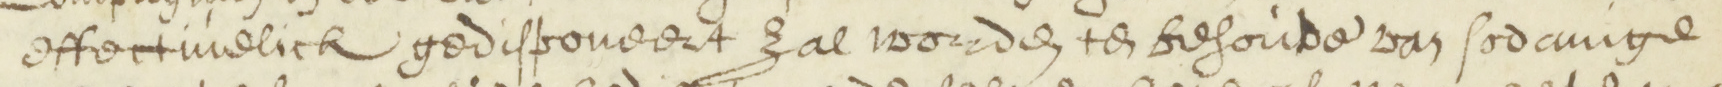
effectiuelick gedisponeert zal worden ten behoude van sodanige
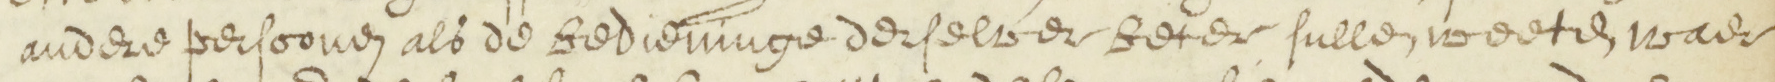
andere persoonen als de bedieninge derselver beter sullen weeten waer
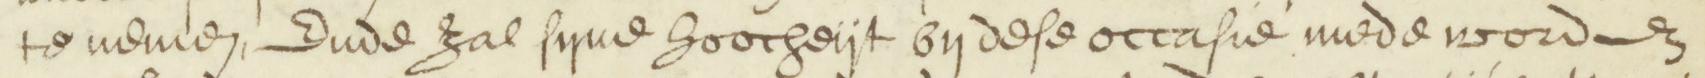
te nemen. Ende zal syne hoocheijt by dese occasie mede worden
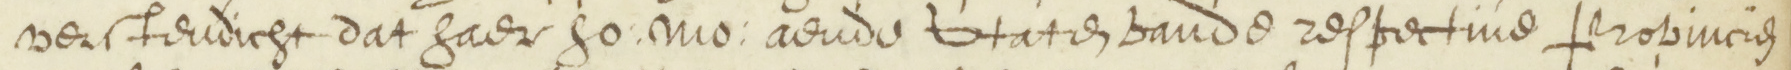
verstendicht dat haer ho:mo: aende Staten vande respectiue Provincien
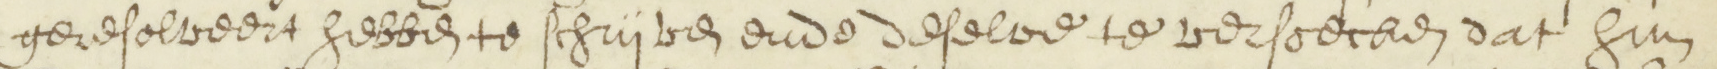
geresolveert hebben te schrijven ende deselve te versoecken dat hun
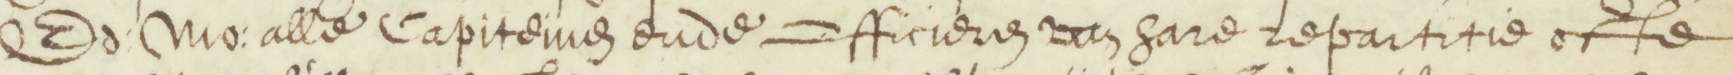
Ed:Mo: alle Capiteinen ende Officieren van hare reparititie ofte
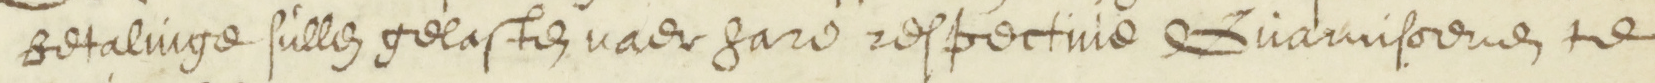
betalinge sullen gelasten naer hare respectiue Guarnisoenen te
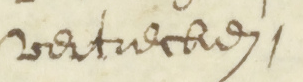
vertrecken.
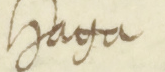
Haga
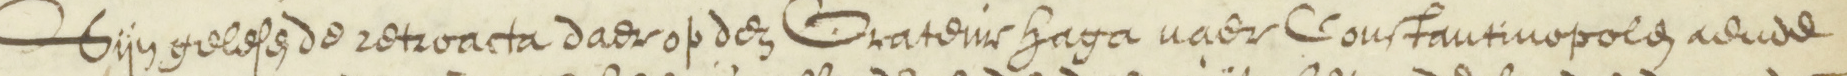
Sijn gelesen de retroacta daer op den Orateur Haga naer Constantinopolen aende
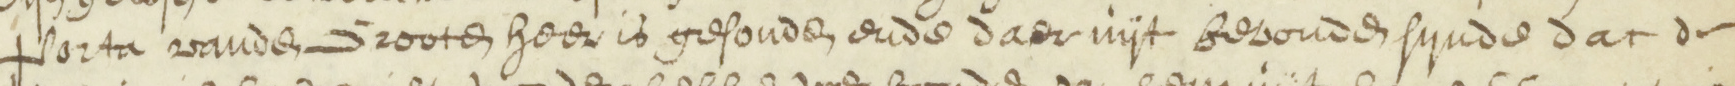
Porta vanden Grooten heer is gesonden ende daer uijt bevonden synde dat de
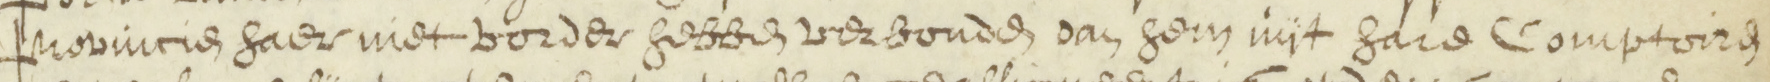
Provincien haer niet vorder hebben verbonden dan hem uijt hare Comptoiren
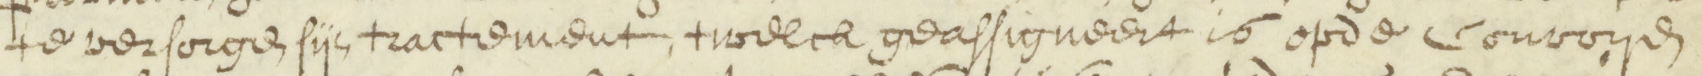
te versorgen sijn tractement, twelck geassigneert is opde Convoyen
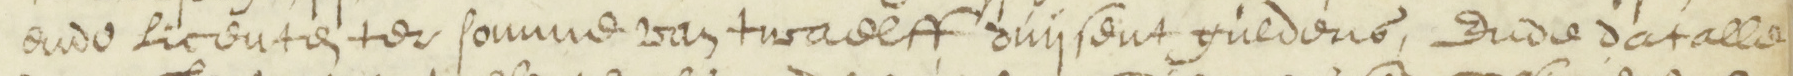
ende licenten ter somme van twaelff duijsent guldens, Ende dat alle
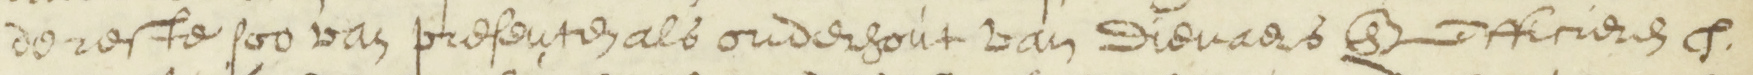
de reste soo van presenten als onderhout van Dienaers & Officieren @.
